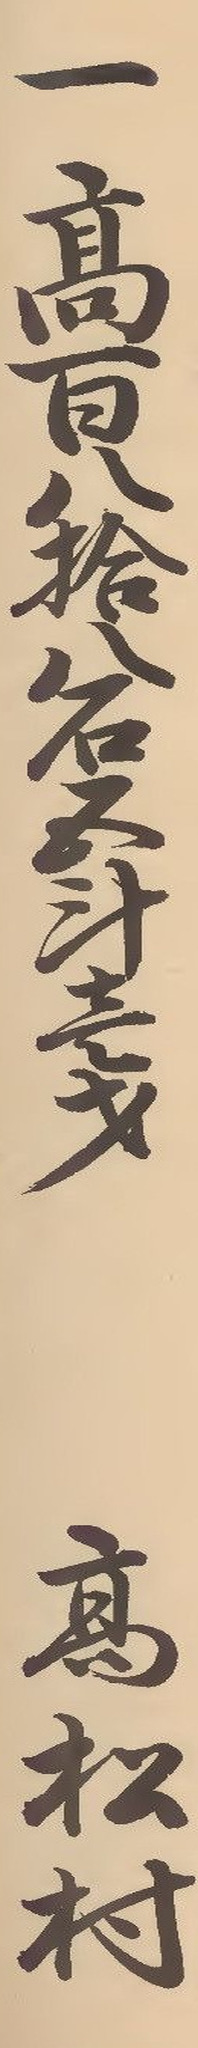一高百八拾八石五斗壱才高松村
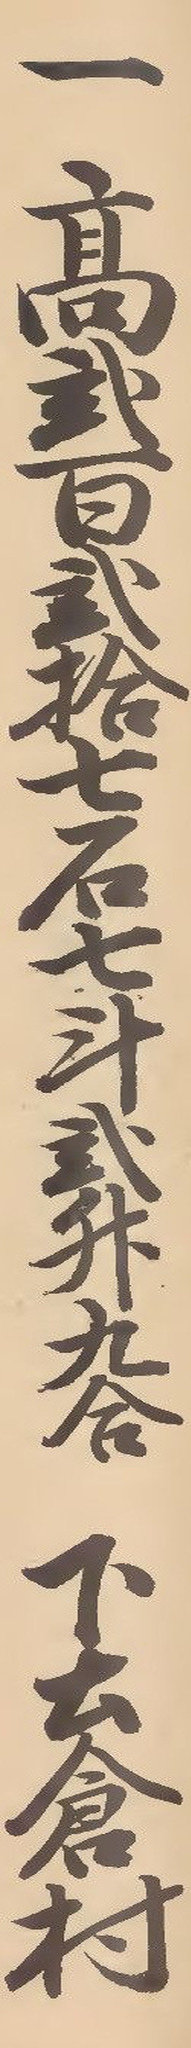一高弐百弐拾七石七斗弐升九合下土倉村
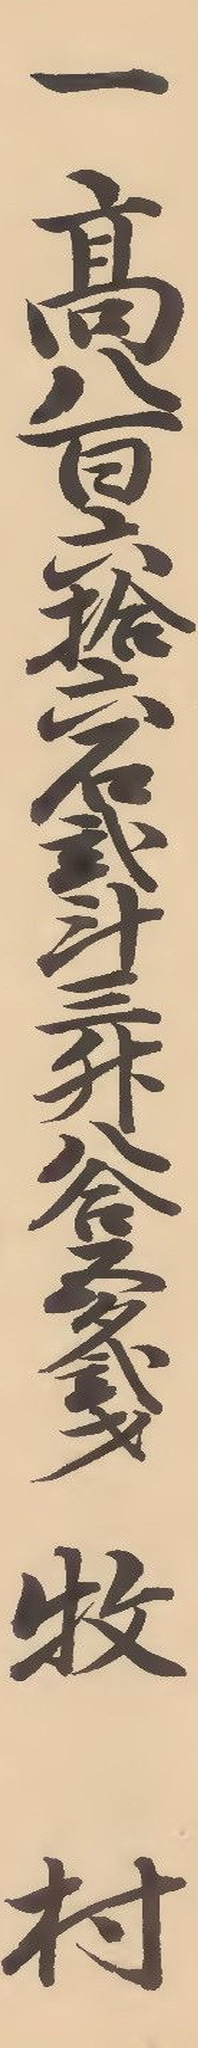一高八百六拾六石弐斗三升八合五勺弐才枚村
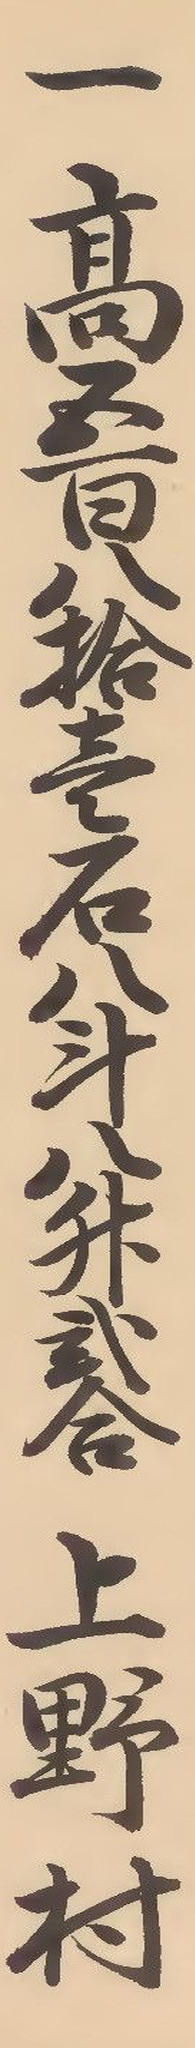一高五百八拾壱石八斗八升弐合上野村
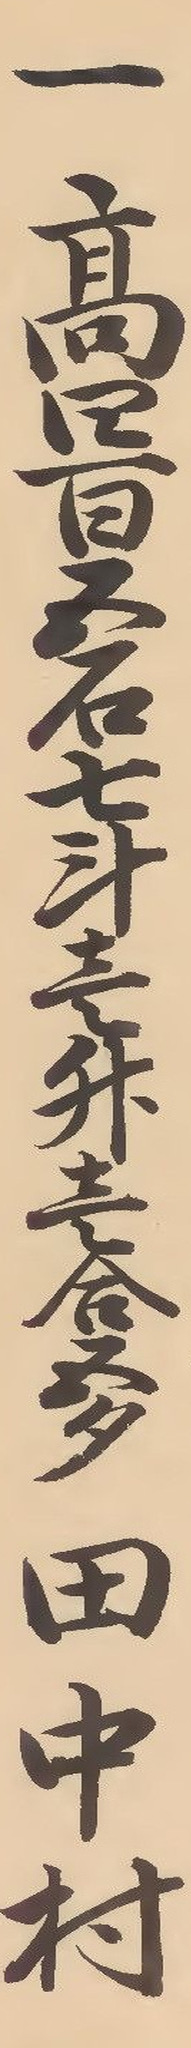一高四百五石七斗壱升壱合五勺田中村

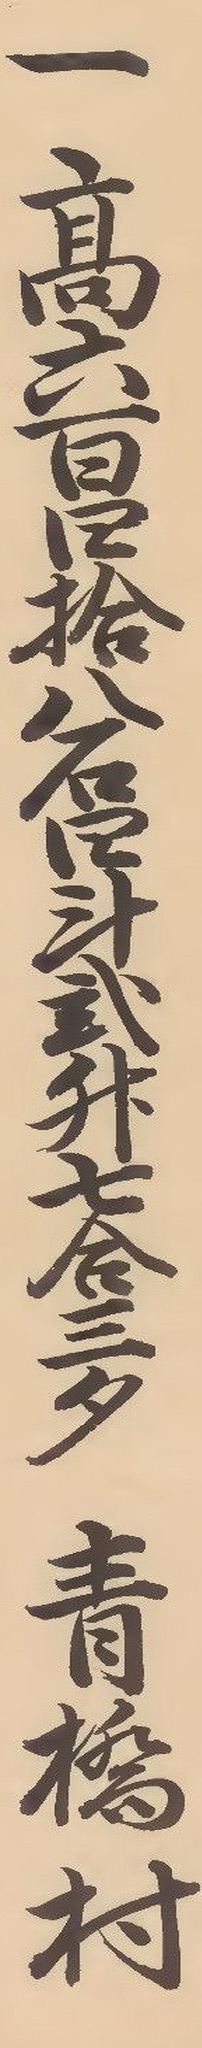一高六百四拾八石四斗弐升七合三勺青橋村
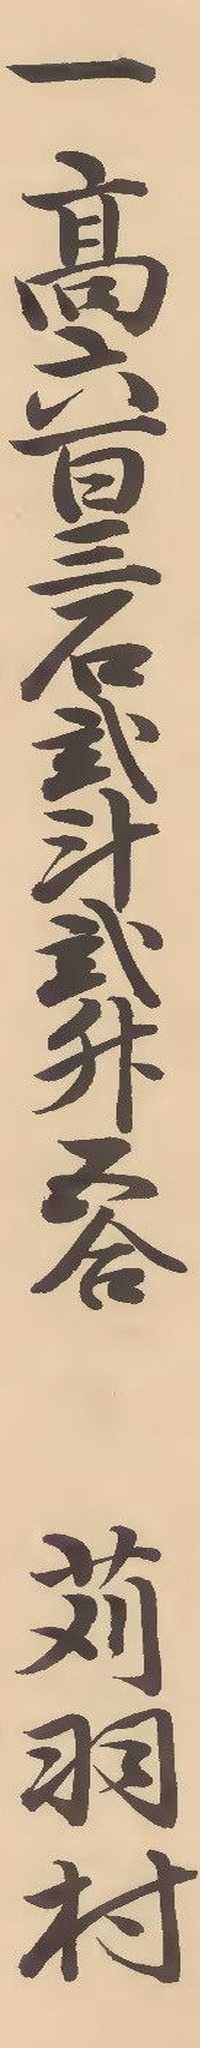一高六百三石弐斗弐升五合苅羽村
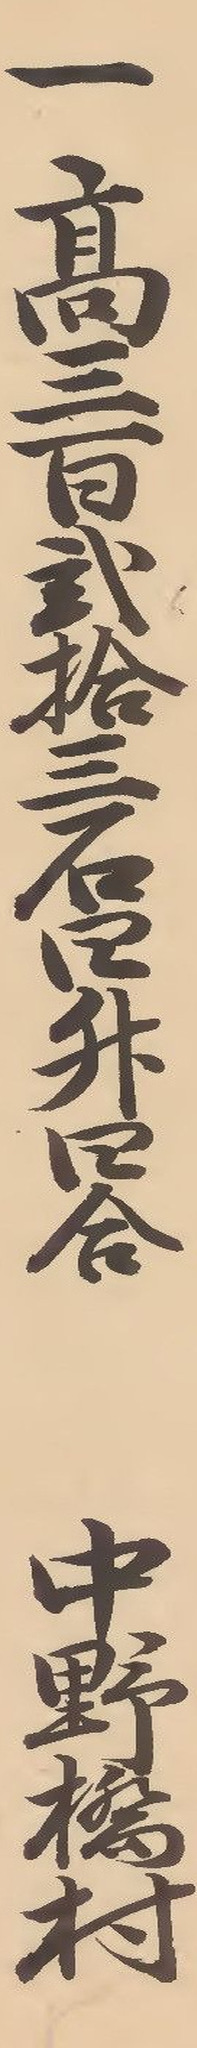一高三百弐拾三石四升四合中野橋村
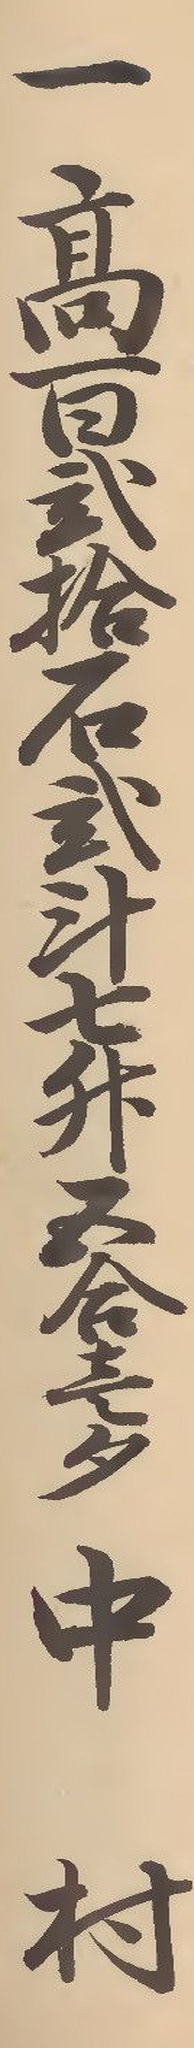一高百弐拾石弐斗七升五合壱勺中村
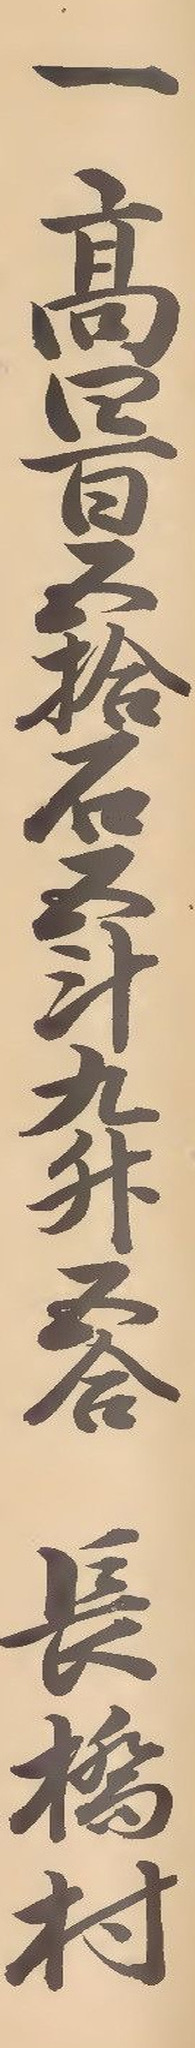一高四百五拾石五斗九升五合長橋村
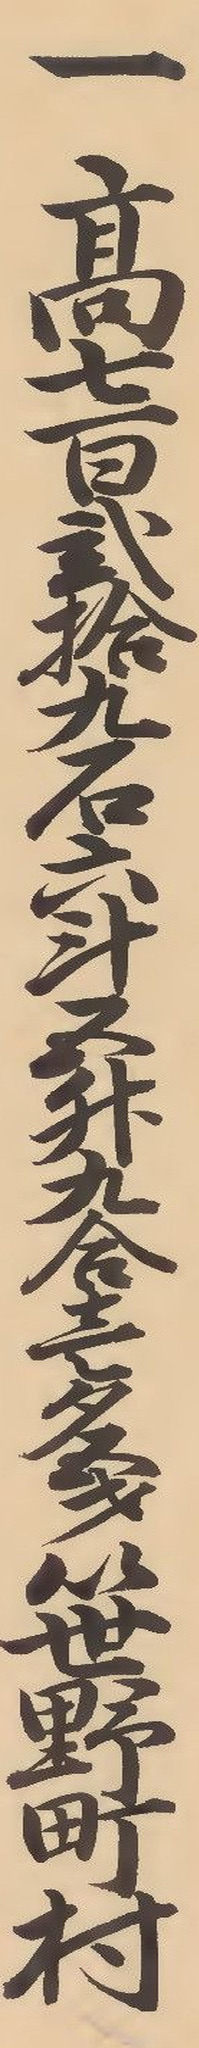一高七百弐拾九石六斗五升九合壱勺五才笹野町村
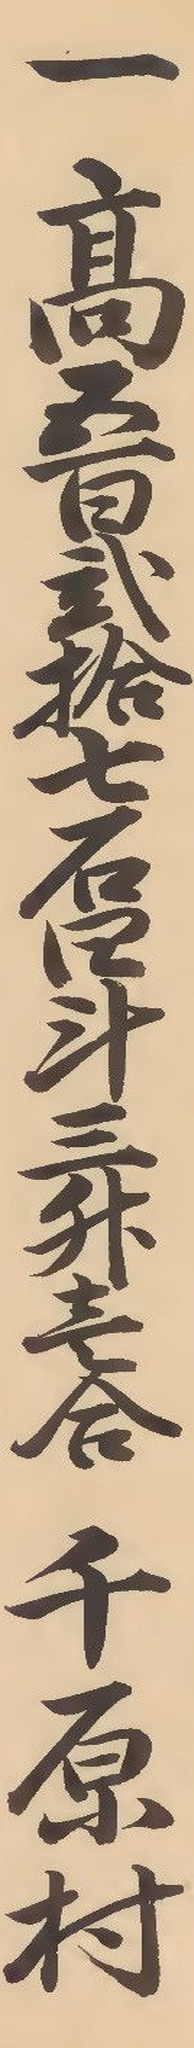一高五百弐拾七石四斗三升壱合千原村
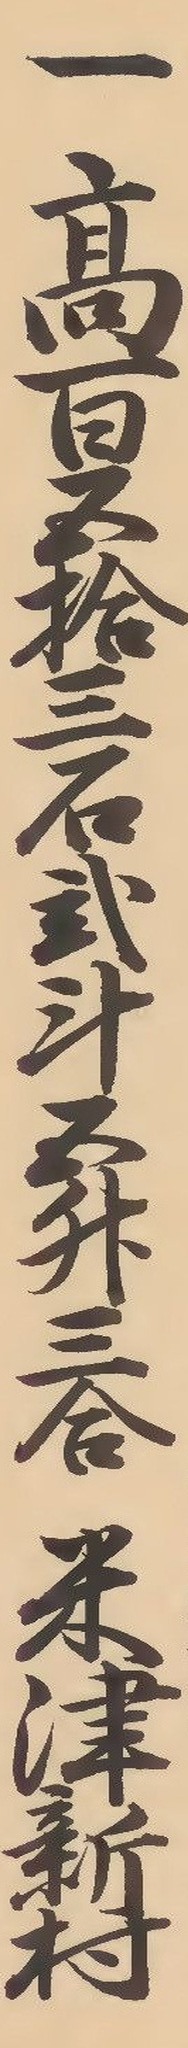一高百五拾三石弐斗五升三合米津新村

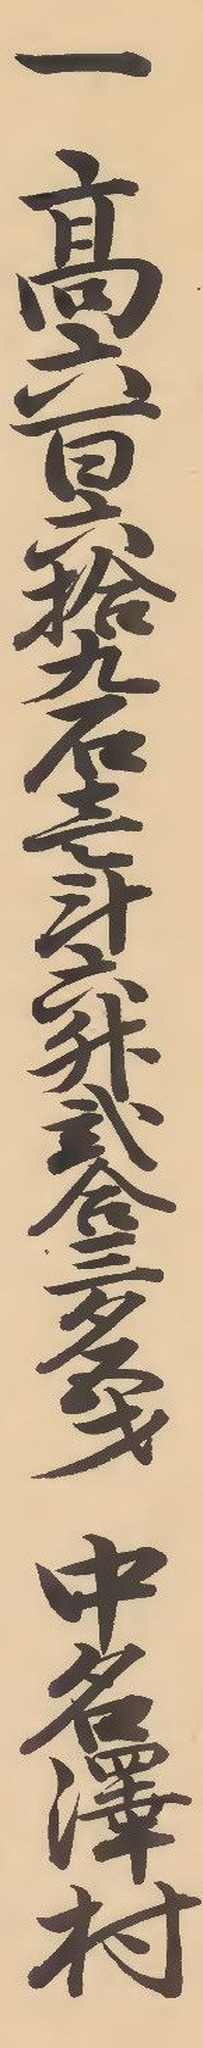一高六百六拾九石壱斗六升弐合三勺五才中名沢村
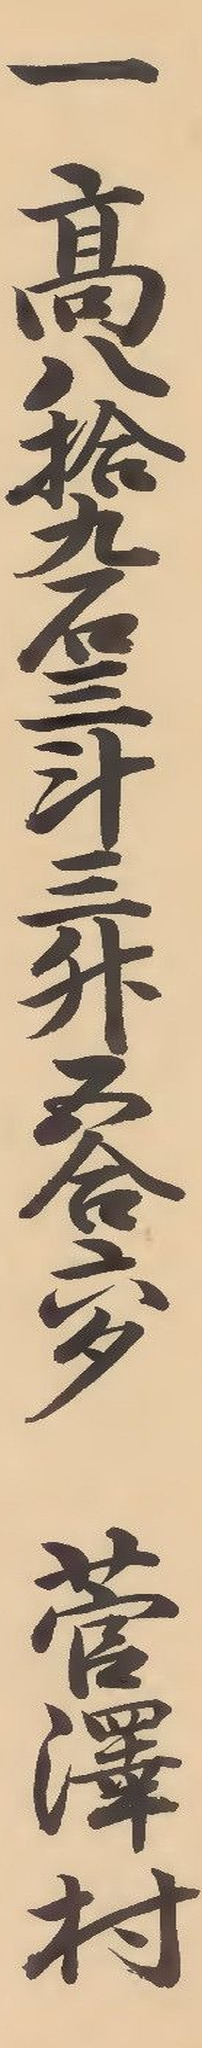一高八拾九石三斗三升五合六勺菅沢村
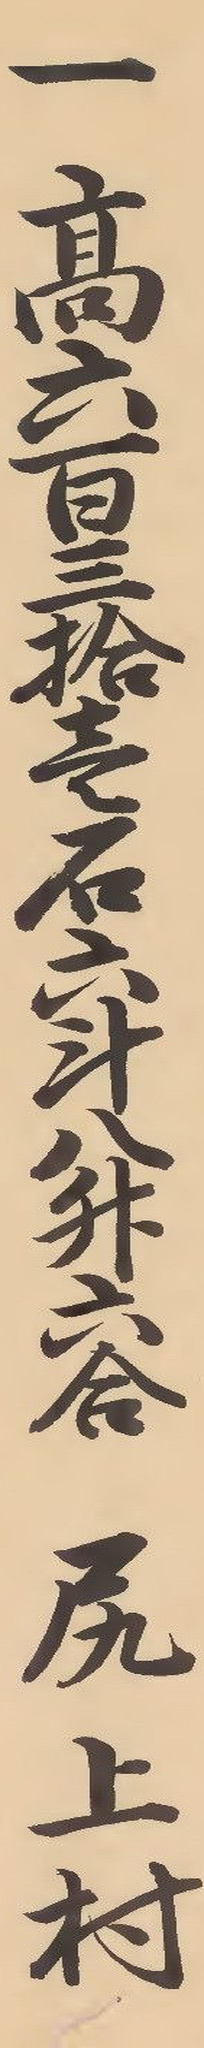一高六百三拾壱石六斗八升六合尻上村
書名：越後国郷帳　下
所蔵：国立公文書館 National Archives of Japan
